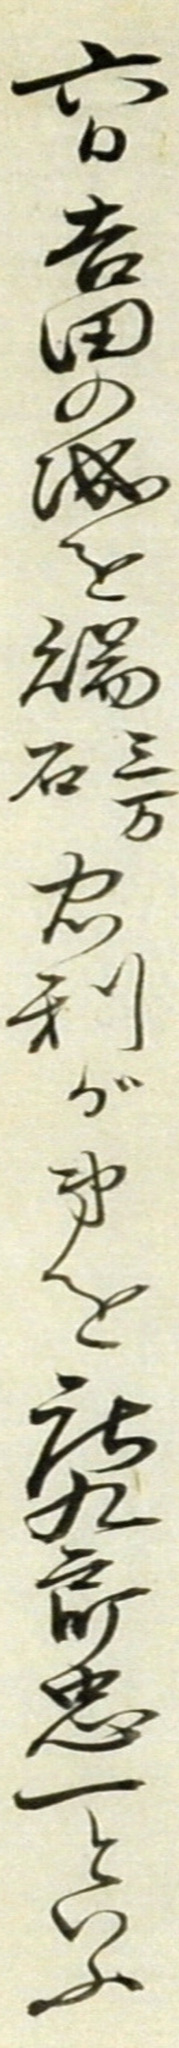六日吉田の城を賜三万石忠利が弟を庄九郎忠一といふ
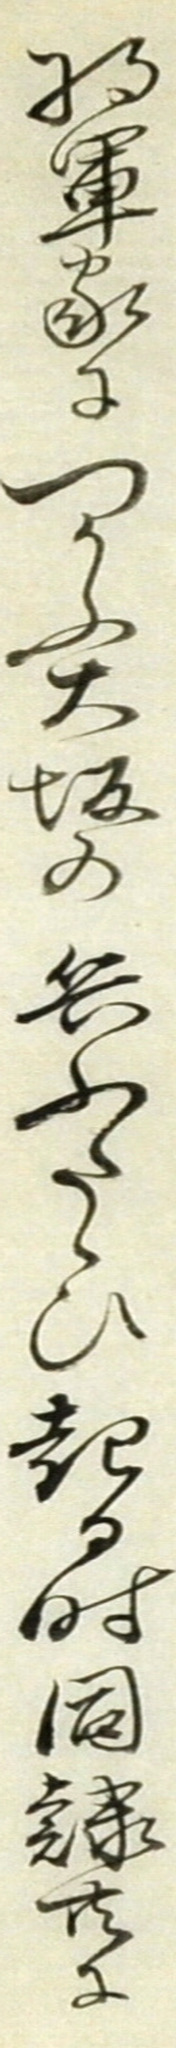将軍家につかふ大坂の兵ふたゝひ起る時同隷共に
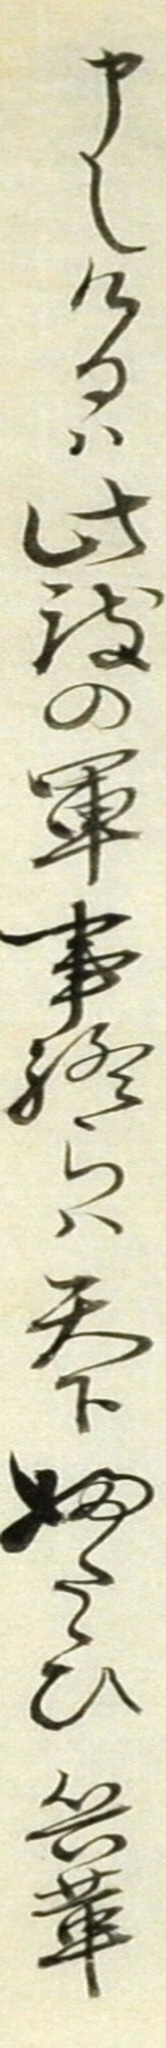申しけるは此度の軍事終らは天下ふたゝひ兵革
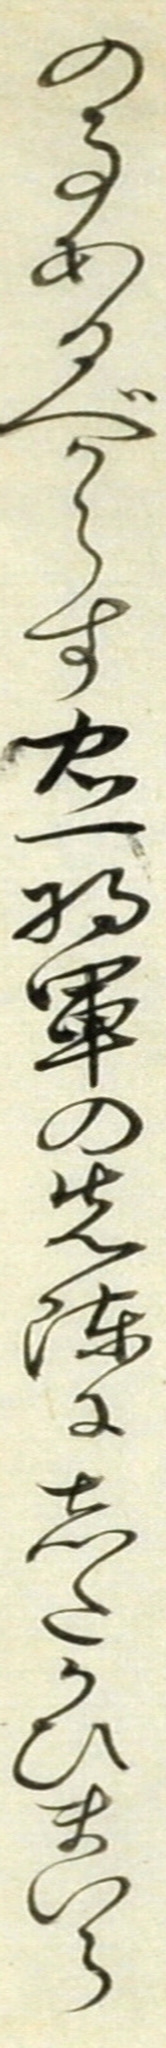の事あるべからす忠一将軍の先陣にしたかひまいら
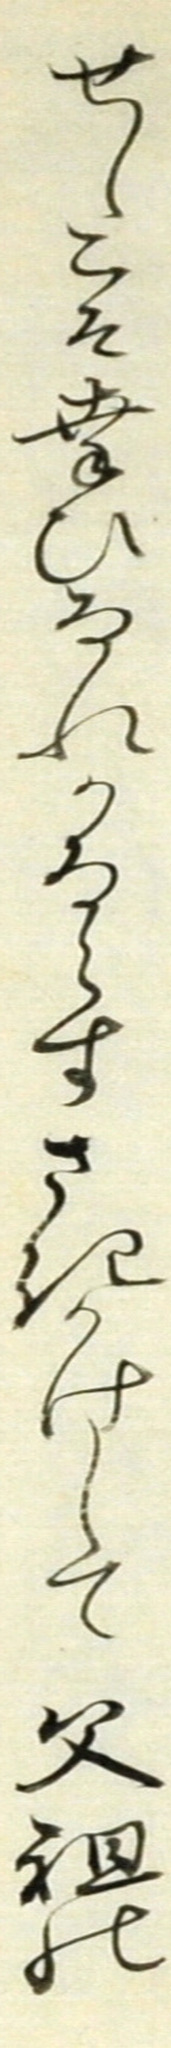せしこそ幸ひなれかならすさきかけして父祖の
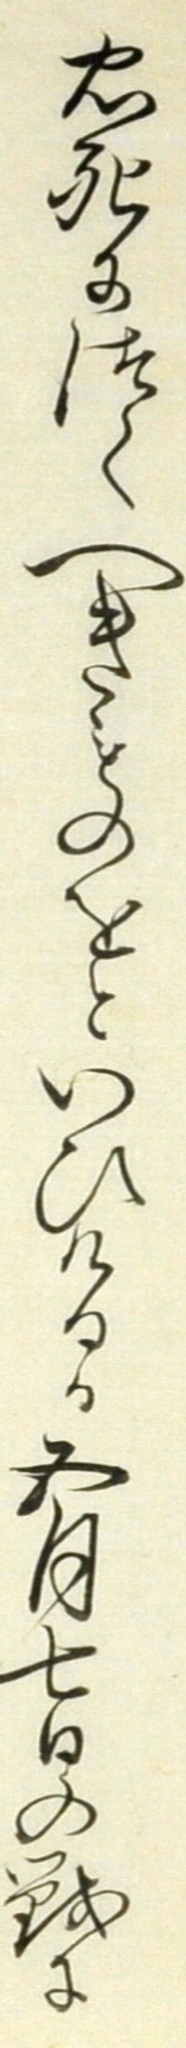忠死につくへきものをといひけるか五月七日の戦に
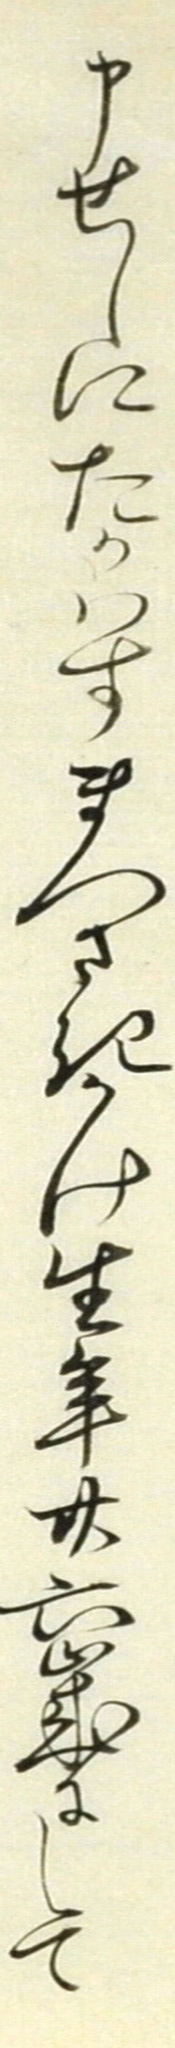申せしにたかはすまつさきかけ生年二十六歳にして
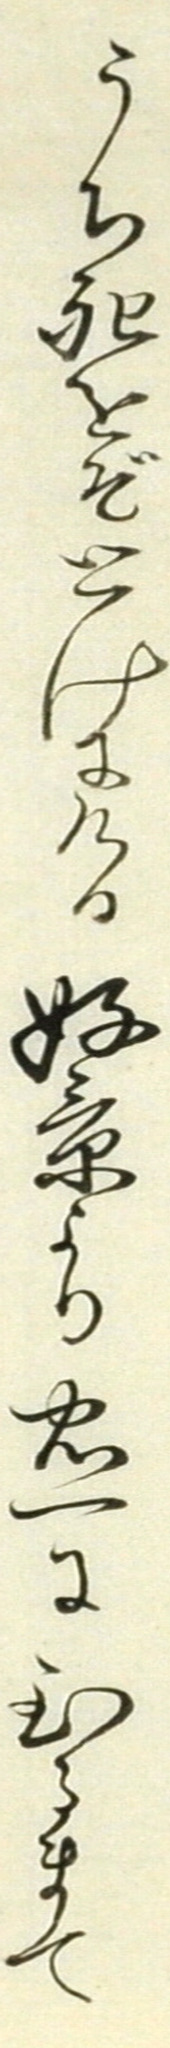うち死をぞとけにける好景より忠一に至るまて
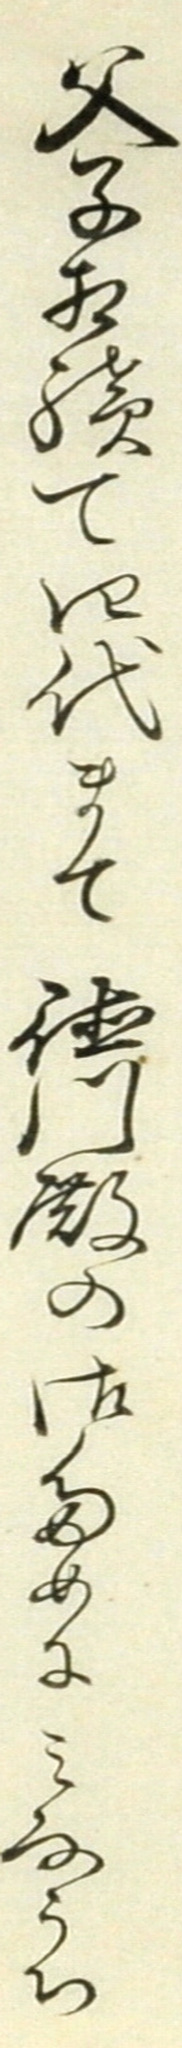父子相続て四代まて徳川殿の御ためにみなうち
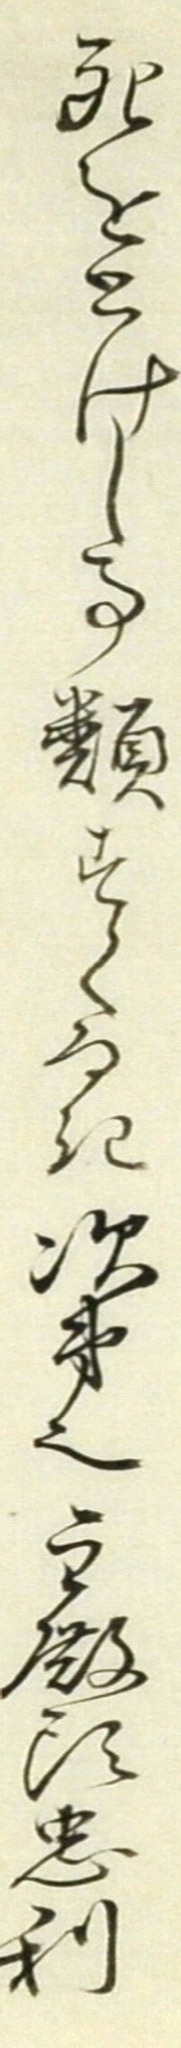死をとけし事類すくなき次第也主殿頭忠利
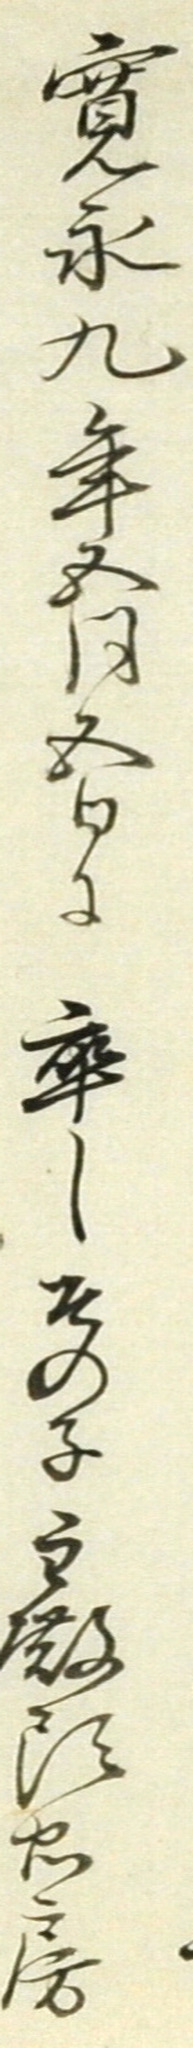寛永九年五月五日に卒しその子主殿頭忠房
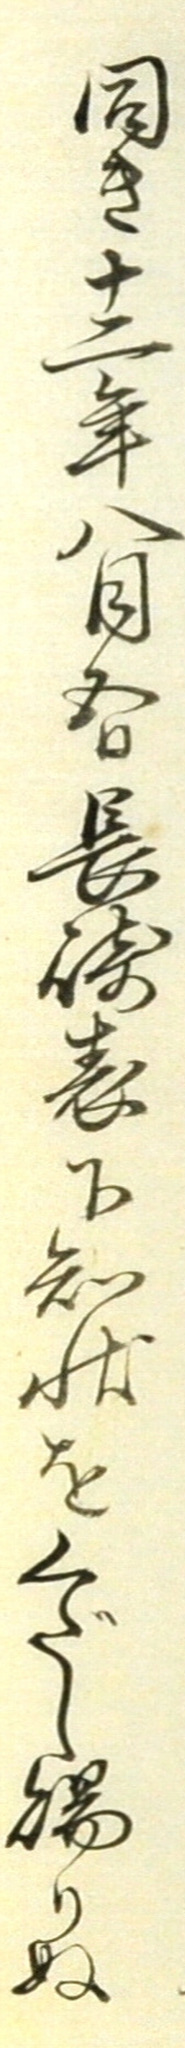同き十二年八月五日長崎表下知状をくだし賜りぬ

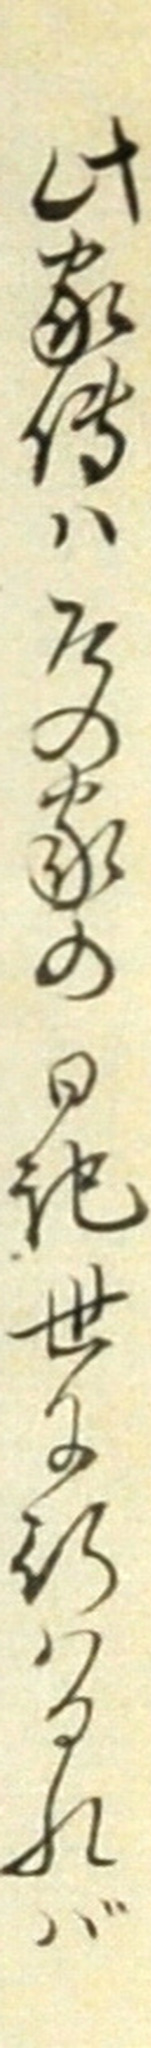此家伝はその家の日記世に行はるれば
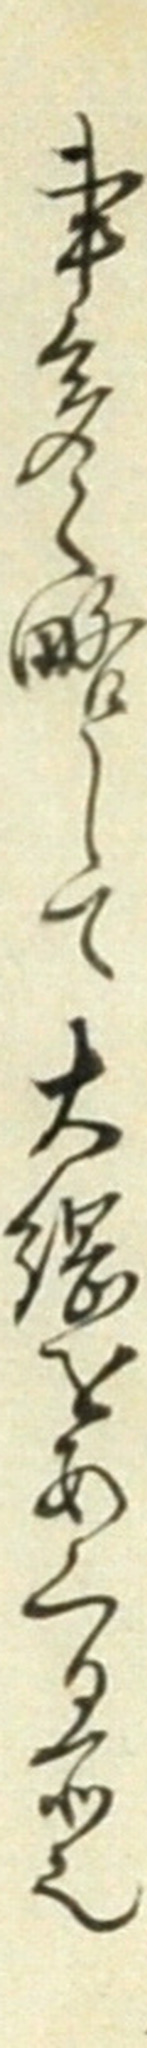事多く略して大綱をあくる所也
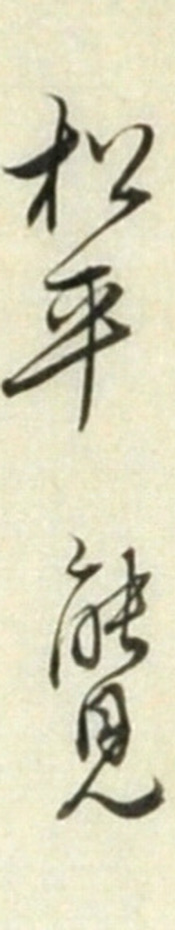松平能見
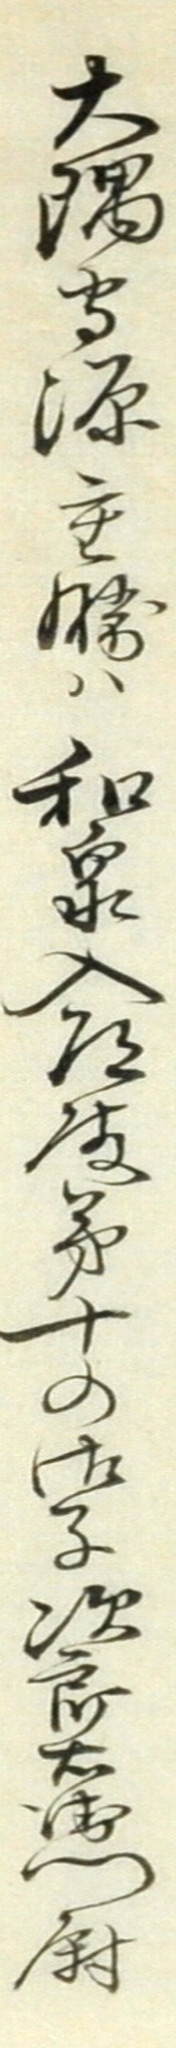大隅守源重勝は和泉入道殿第十の御子次郎右衛門尉
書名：藩翰譜（二・三）
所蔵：伊那市立高遠町図書館・合同会社AMANE
